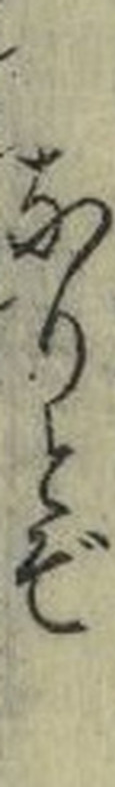なりとぞ
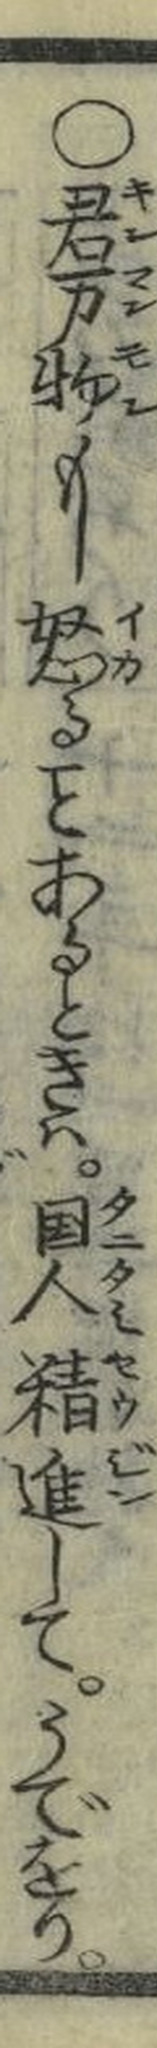〇君万物もし怒ることあるときハ。国人精進して。うでをり。
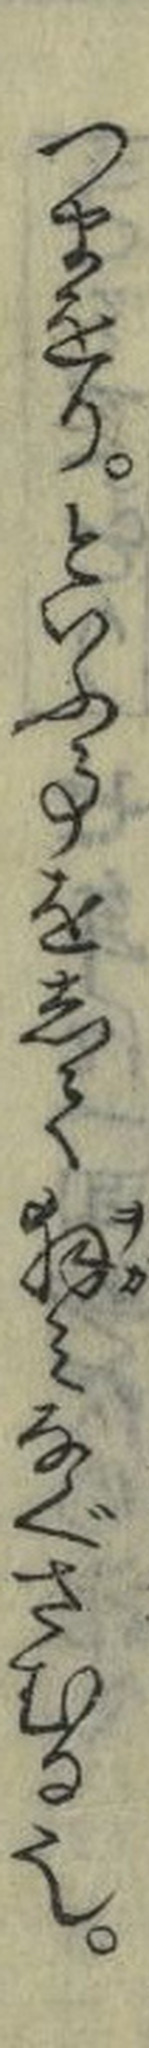つまおり。といふ事をして拝ミなぐさむる也。

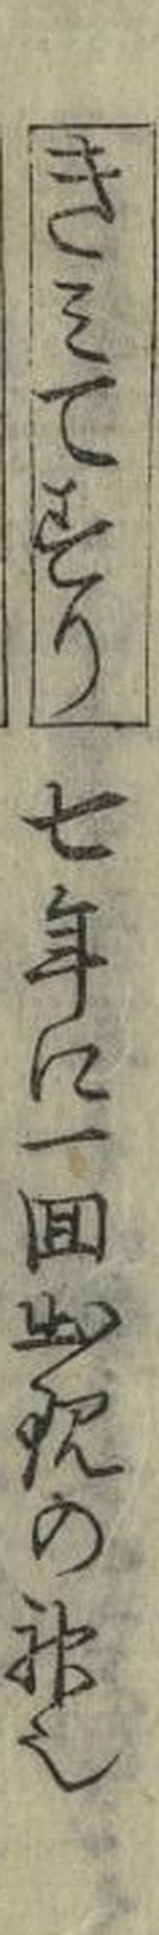[きミてすり]七年に一回出現の神也
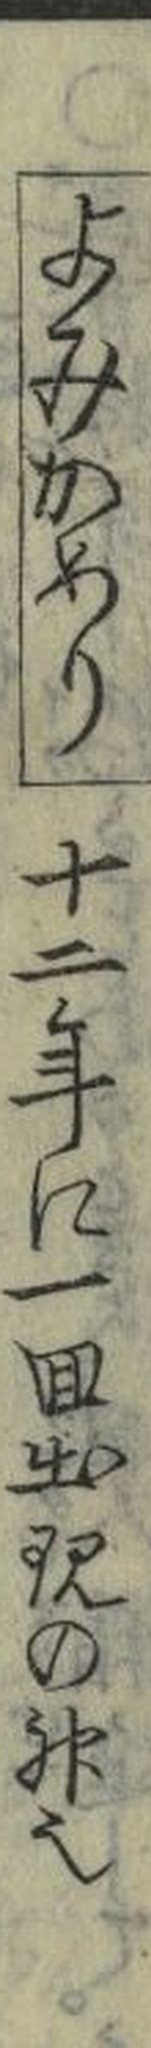[よみかめり]十二年に一回出現の神也
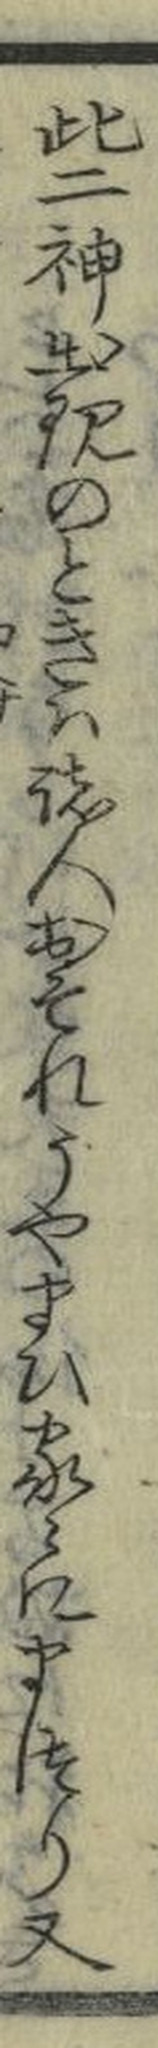此二神出現のときハ諸人おそれうやまひ家々にまつり又
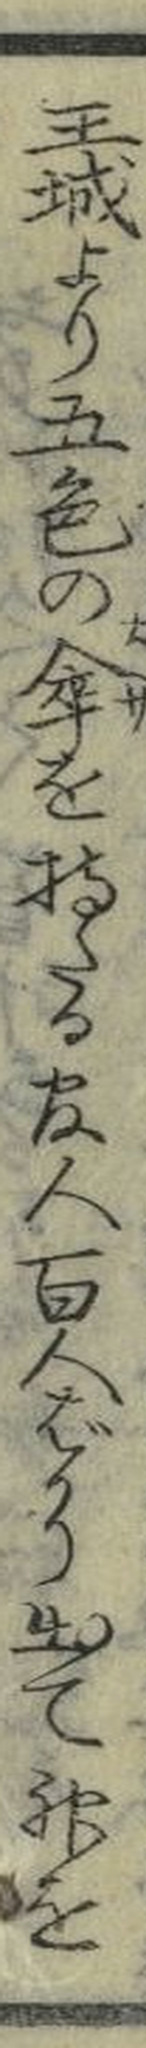玉城より五色の傘を持たる官人百人ばかり出て神を
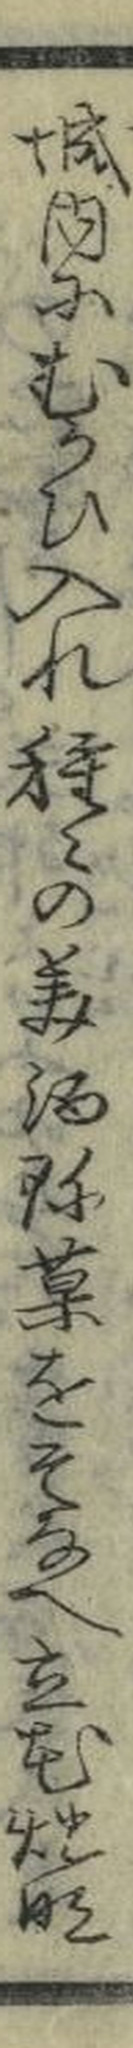城内にむかひ入れ種々の美酒珎菓をそなへ立花燈明
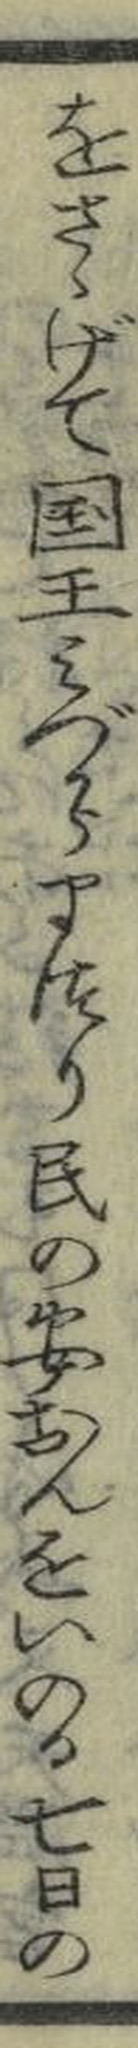をさゝげて国王ミづからまつり民の安おんをいのる七日の
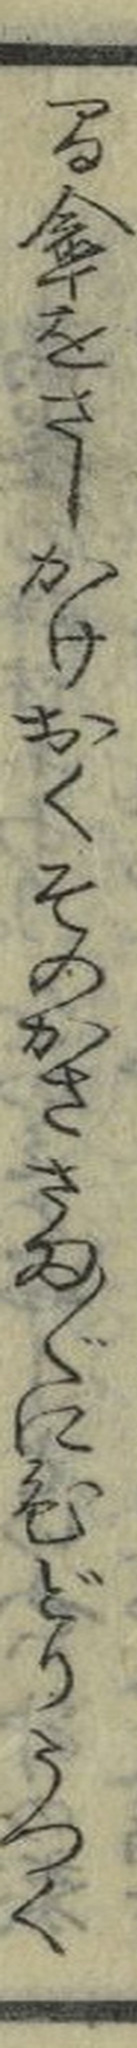間傘をさしかけおくそのかささま〴〵に色どりうつく
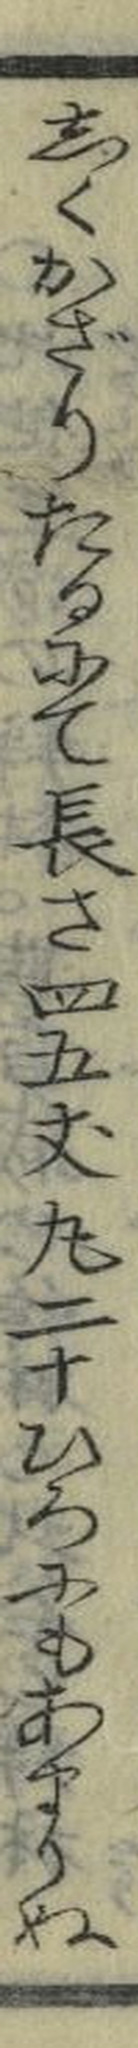しくかざりたるにて長さ四五丈凡二十ひろにもあまりぬ
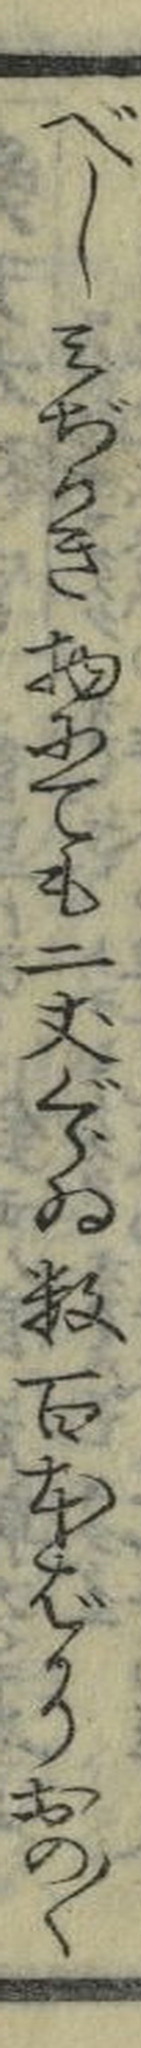べしミじかき物にても二丈ぐらゐ敉百本ばかりおの〳〵
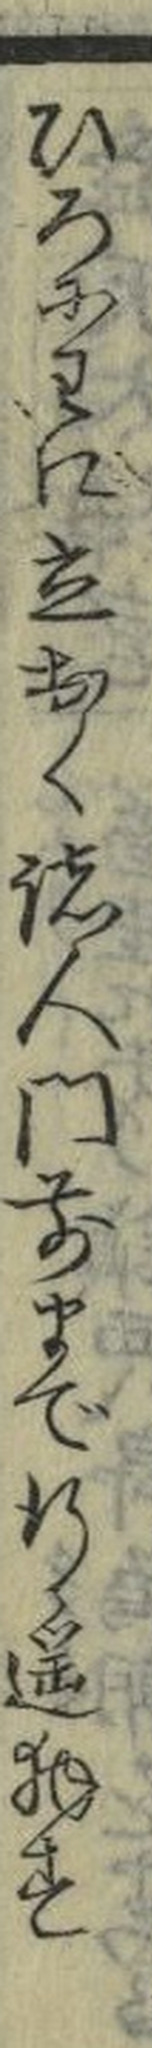ひろにわに立おく諸人門前まで行遥拝す
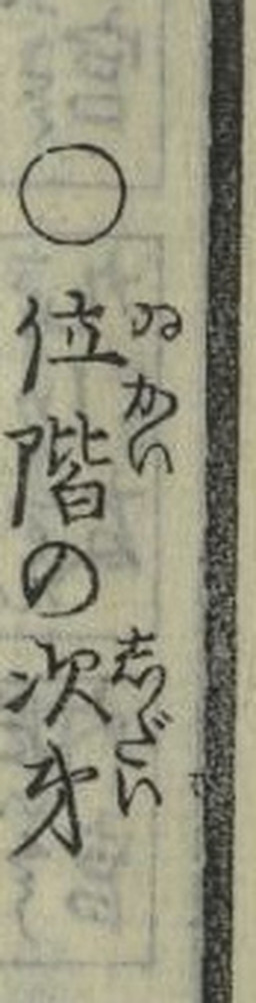〇位階の次第

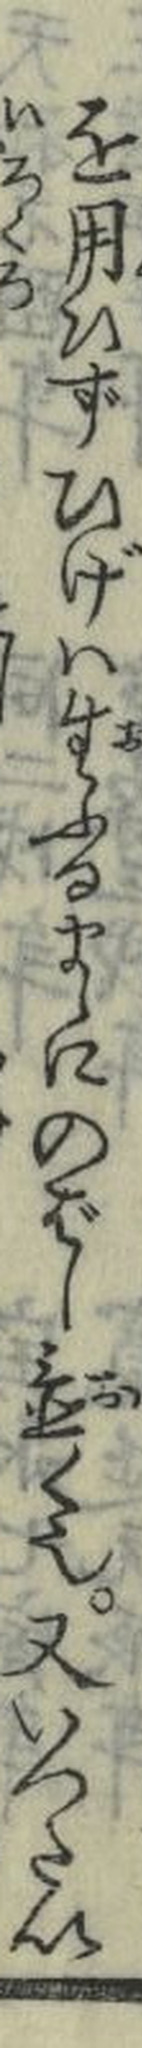を用ひずひげハ生ふるまゝにのばし置く也。又いつたい
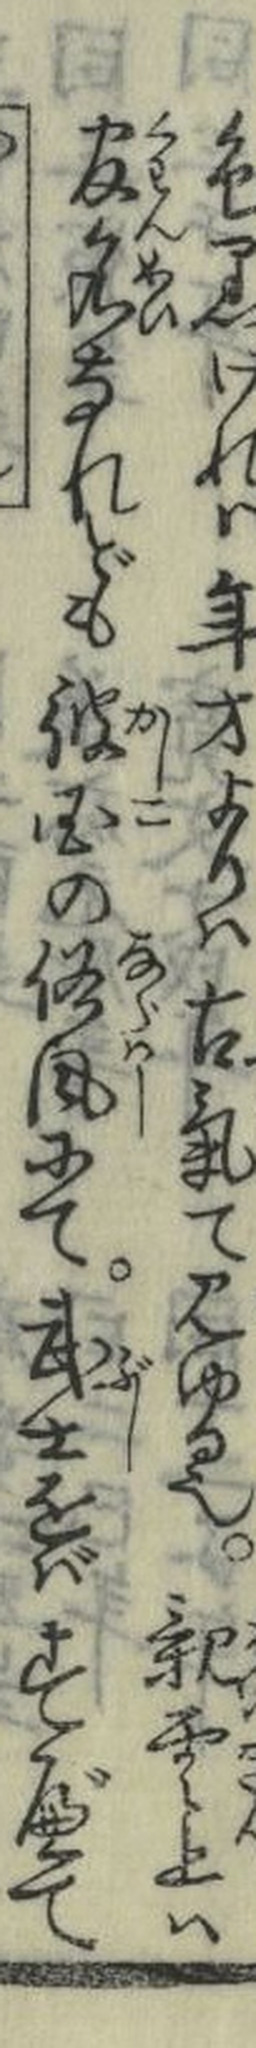官名なれども彼国の俗風にて。武士をバすべて
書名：琉球奇譚
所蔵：University of the Ryukyus Library
